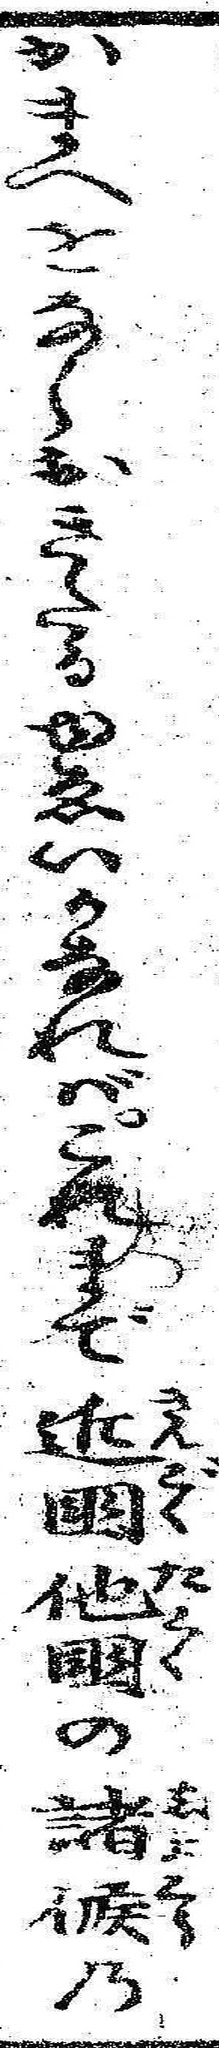かまへをなしおきたるゆゑいかなれば。これまで近国他国の諸候の
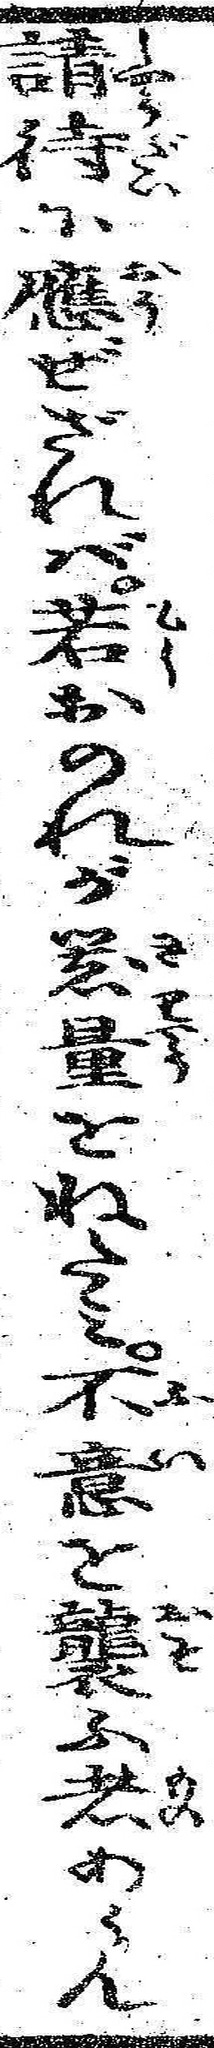請待に応ぜざれば。若おのれが器量をねたみ。不意を襲ふ者あらん
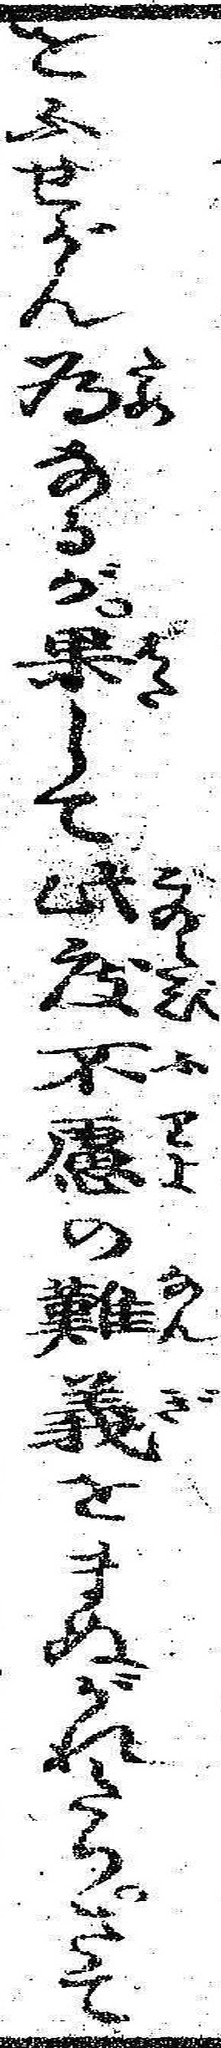をふせがん為なるが。果して此度不慮の難儀をまぬがれたり。さて
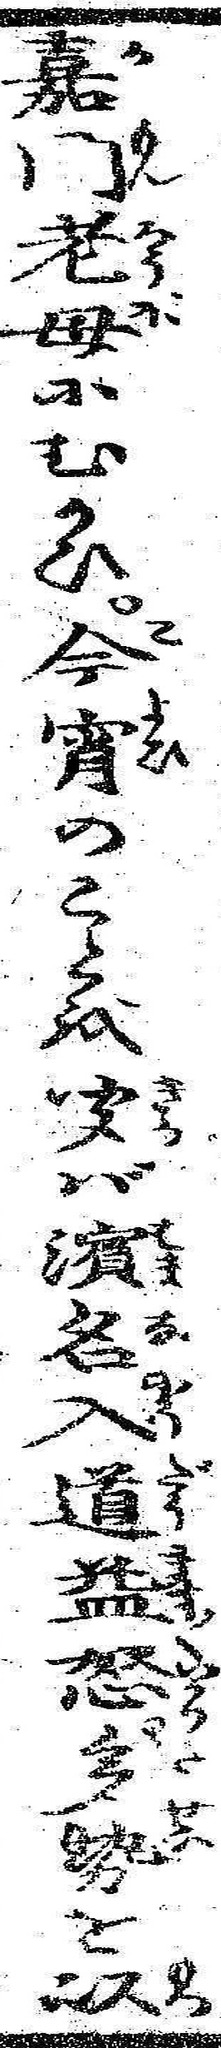嘉門老母にむかひ。今宵のことを聞ば浜名入道益怒。多勢を以
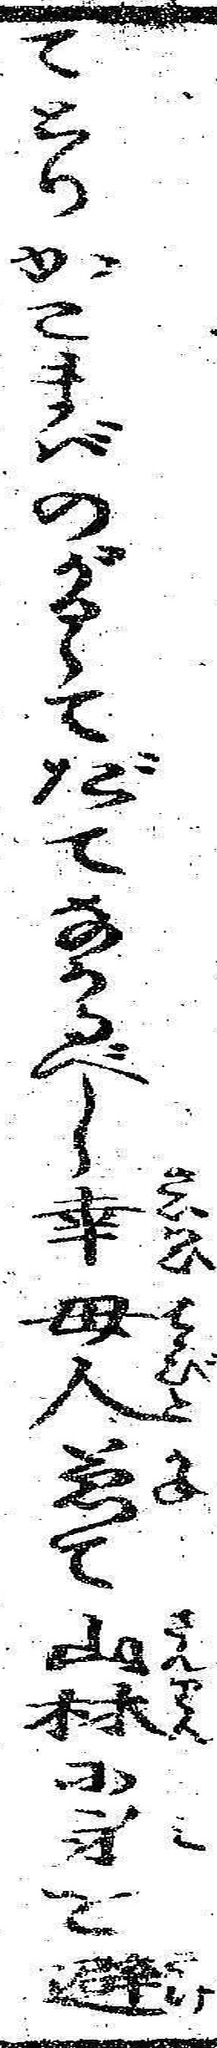てとりかこまばのがるゝてだてなかるべし幸母人兼て山林に身を避
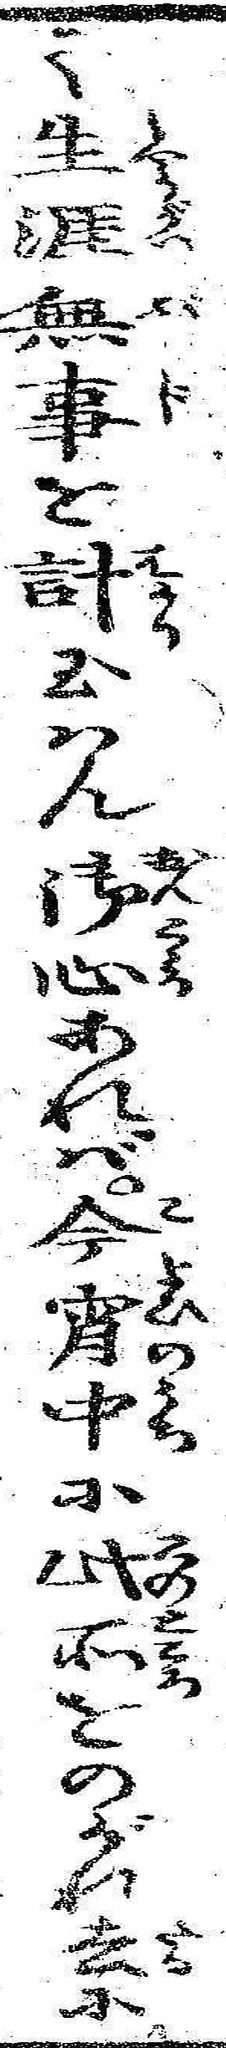て生涯無事を計玉はん御心あれば。今宵中に此所をのがれ去に
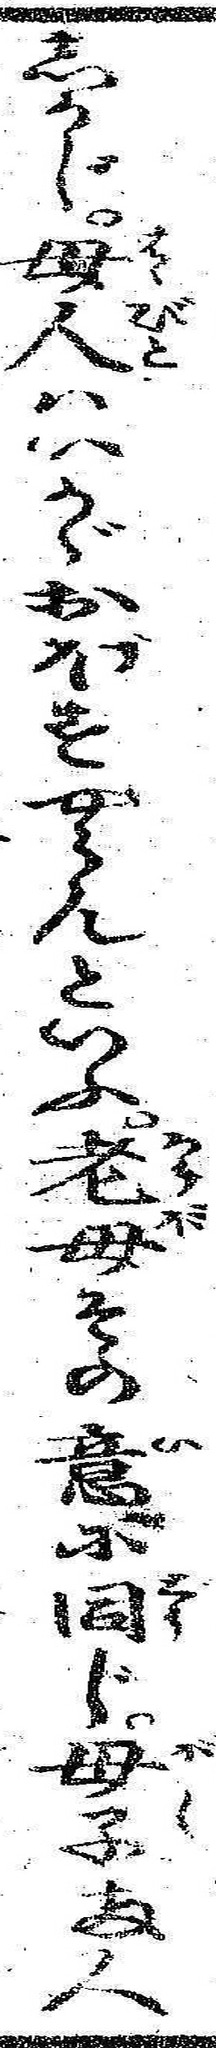しかじ。母人はいかゞおぼすやらんといふ。老母その意に同じ。母子両人
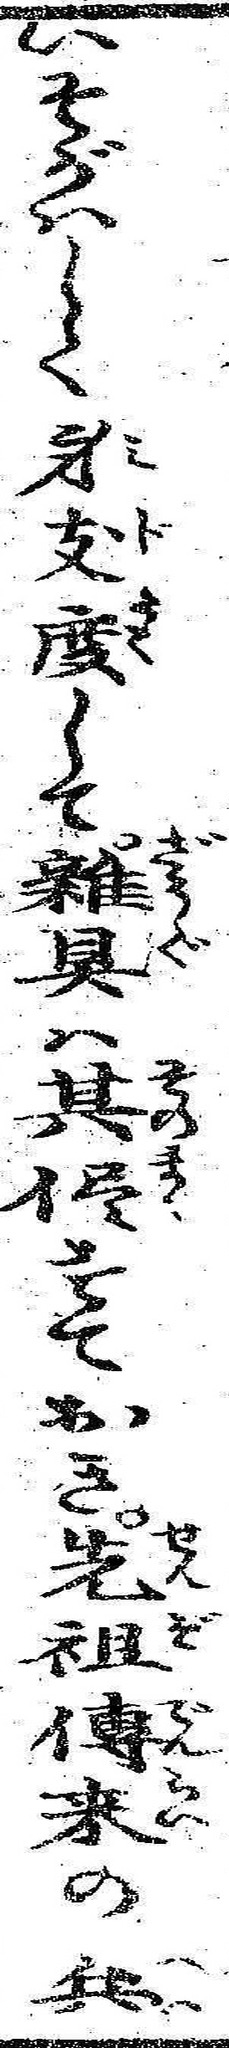いそがはしく身支度して。雑具は其侭すておき。先祖伝来の兵
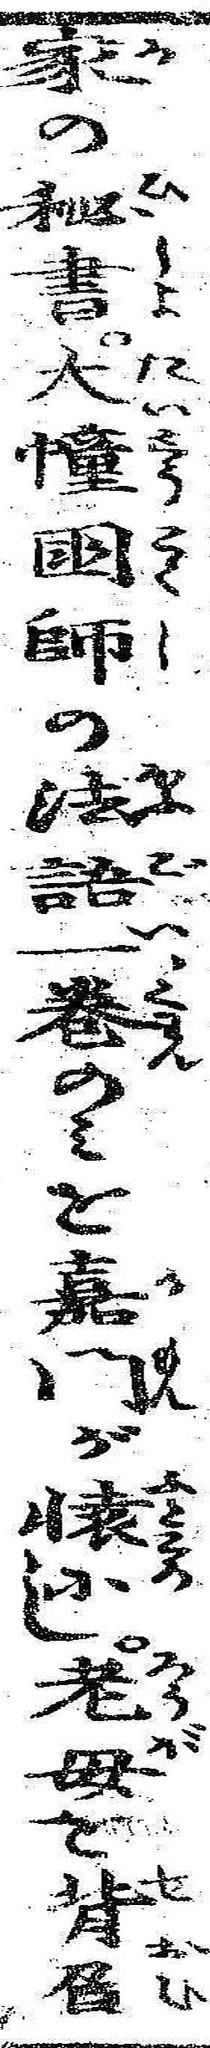家の秘書。大幢国師の法語一巻のみを嘉門が懐にし。老母を背負
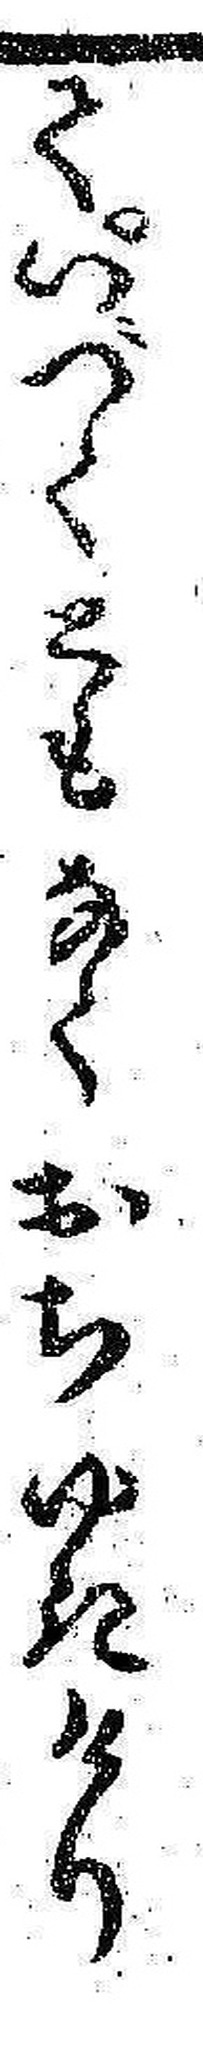て。いづくともなくおちゆきけり
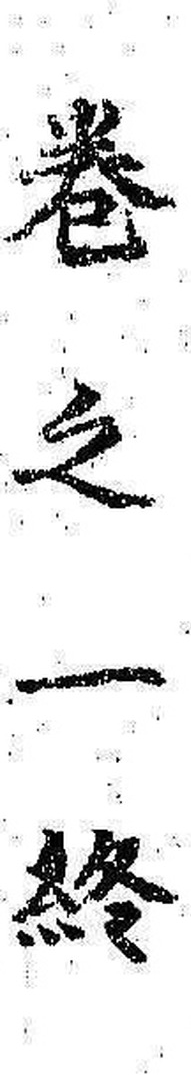巻之一終

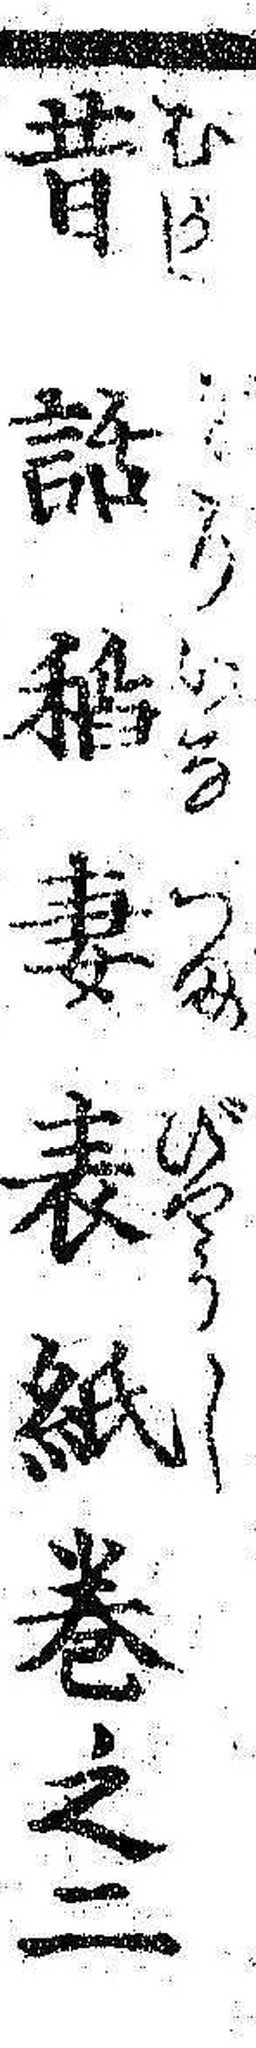昔話稲妻表紙巻之二
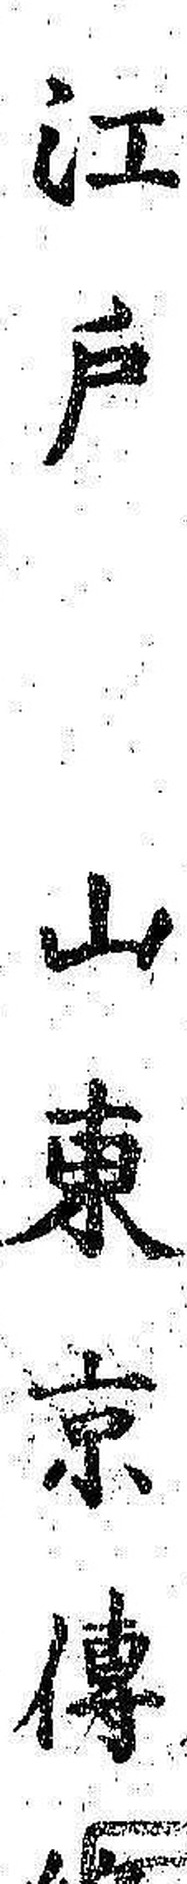江戸山東京伝編
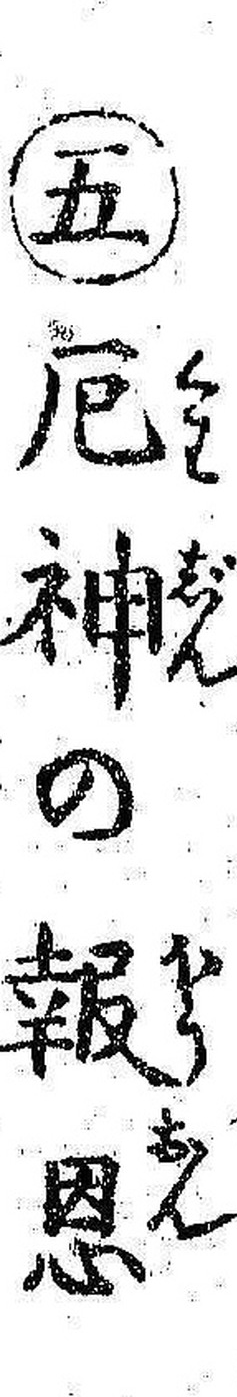五厄神の報恩
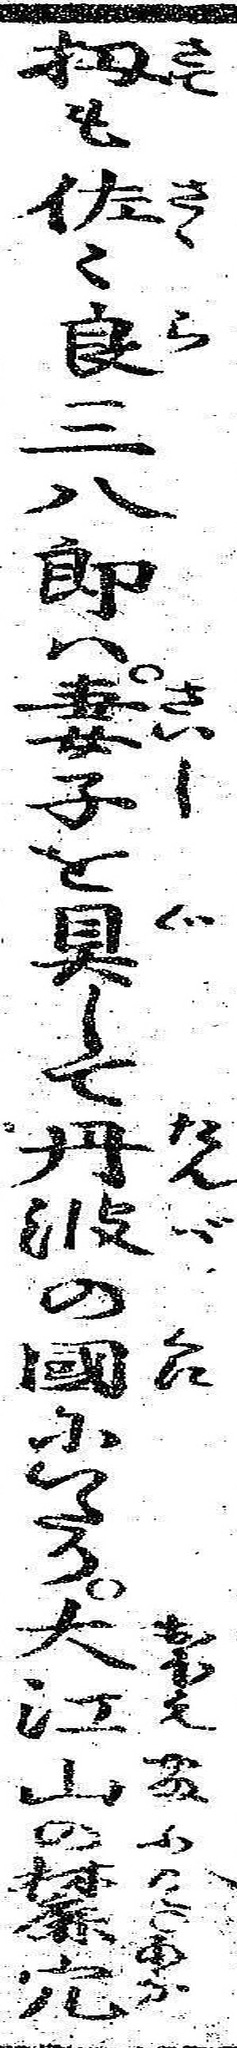扨も佐々良三八郎は。妻子を具して丹波の国にいたり。大江山の麓。穴
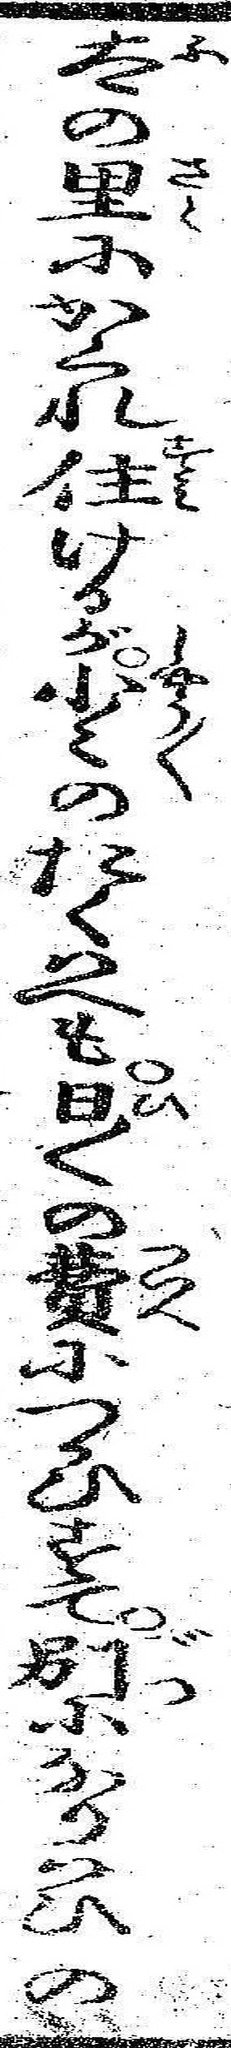太の里にかくれ住けるが。少々のたくはへも。日々の費につかひすて。別になりわひの
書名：昔話稲妻表紙
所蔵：国文学研究資料館
